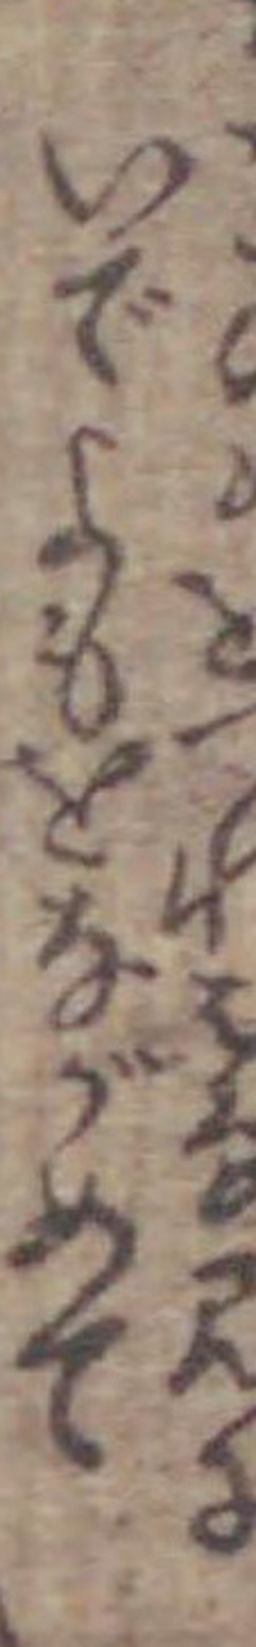いでよもをながめて
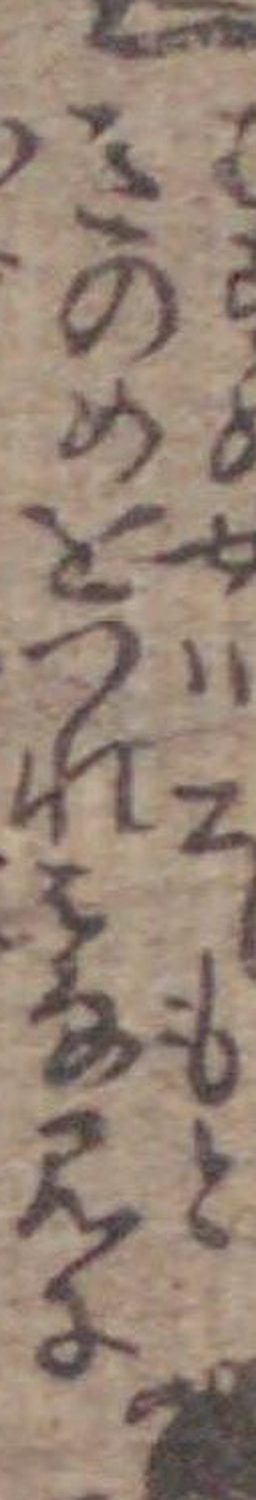きのめをつれはな見に
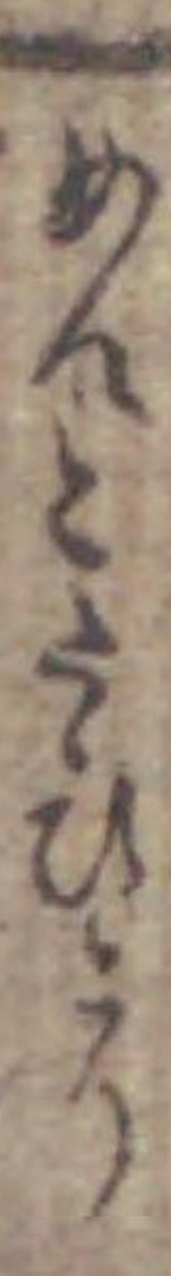めんとたゝひとり
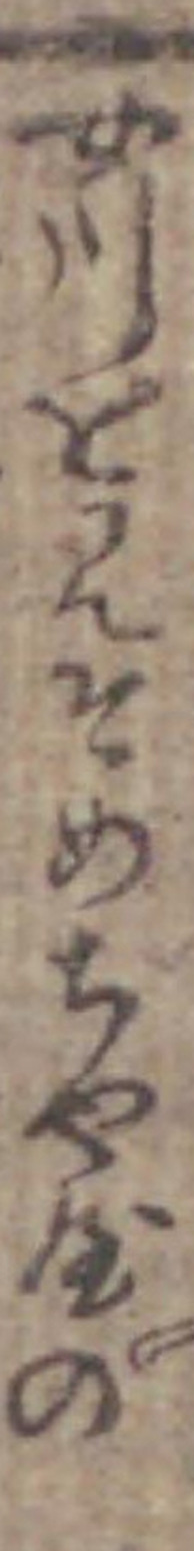女川を見そめちゃ屋の
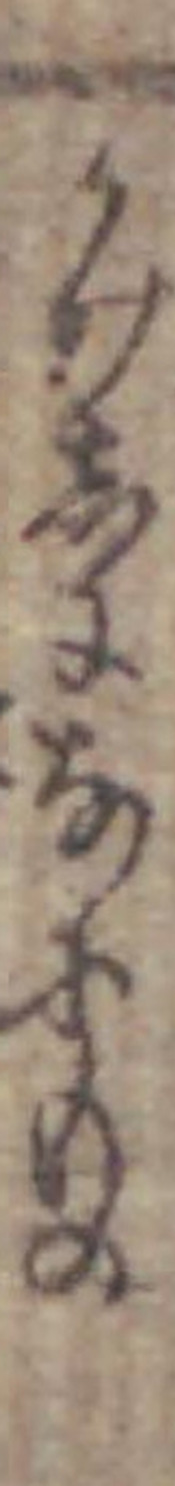かけしになにもの
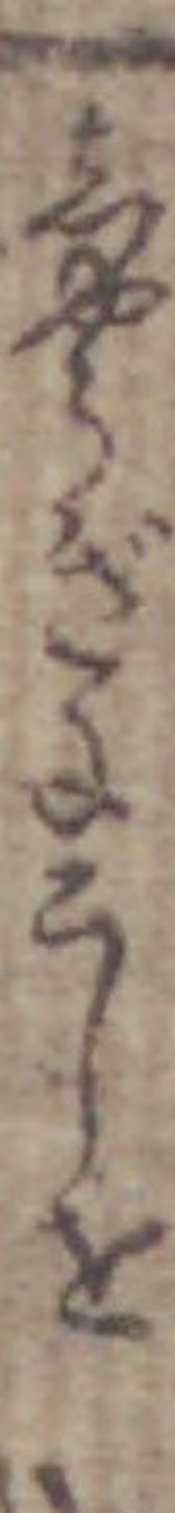しやうぎにこしを
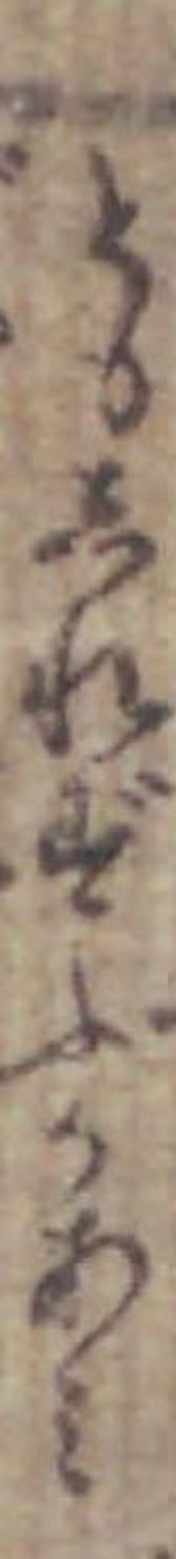ともしれずふかあみ
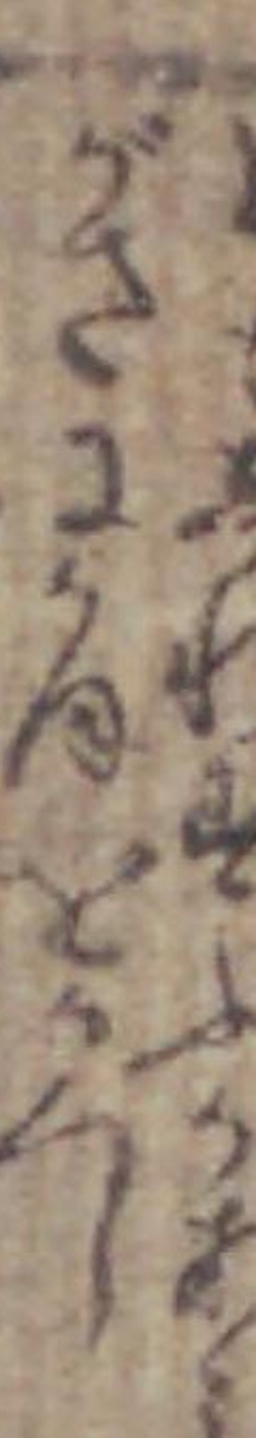がさにかほをかくし
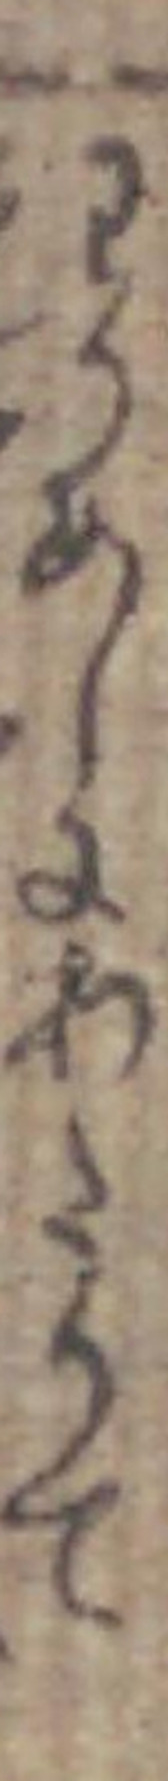わりめしにあたりて
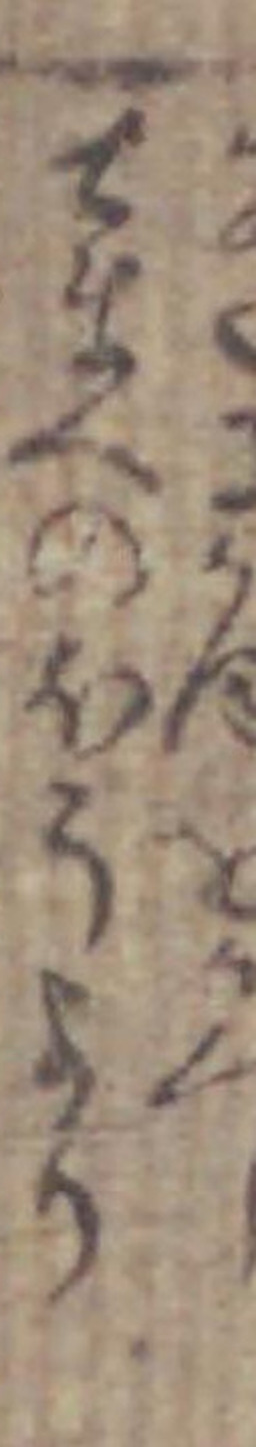てまえのほうより
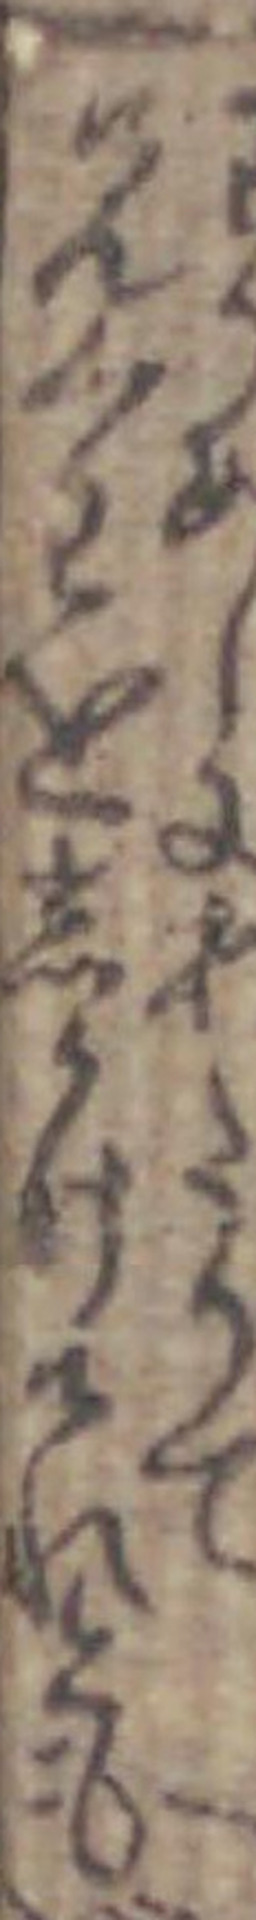けんくゎをしかけけれども
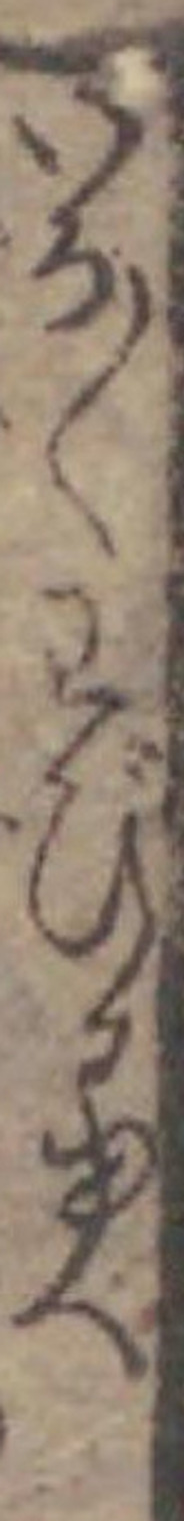いろ〳〵わびるゆへ
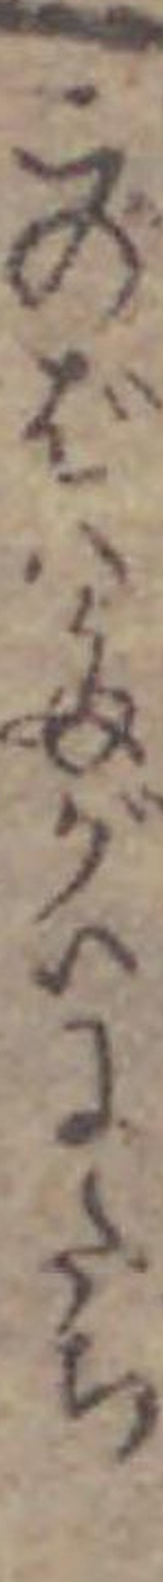このばはたがいにたち
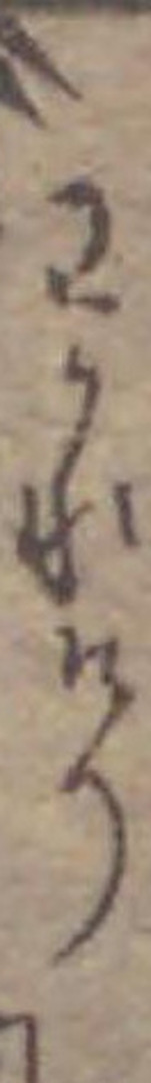わかれけり

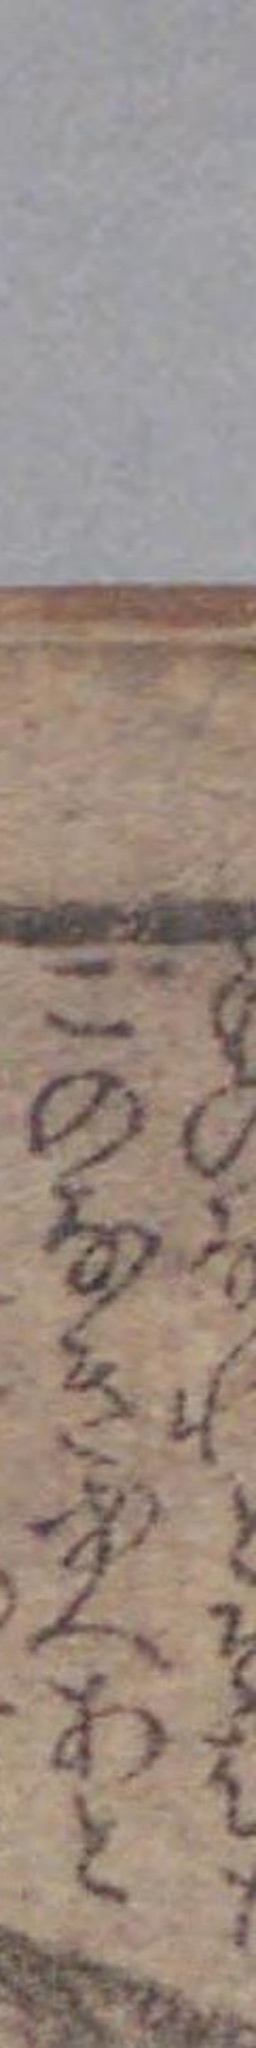このなきゆへあと
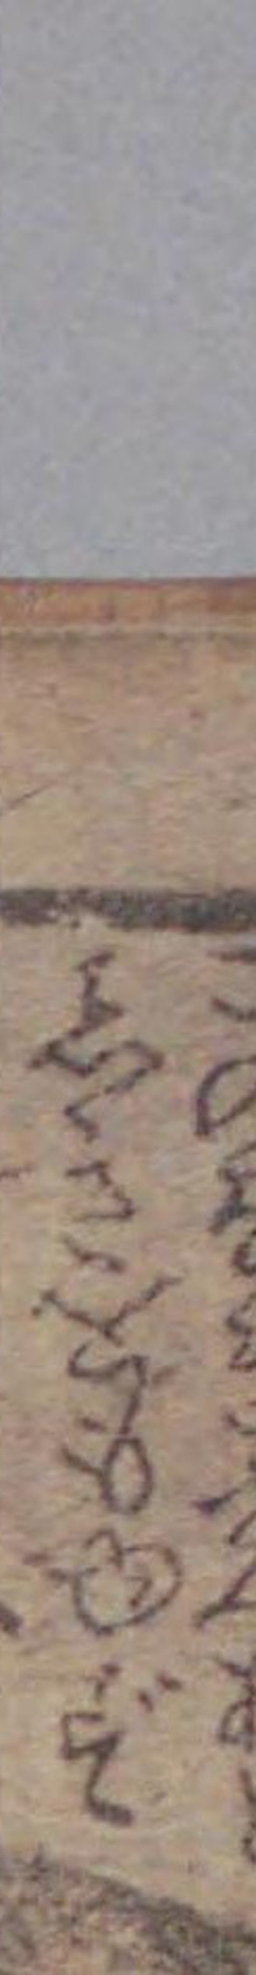しきをもゆず
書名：諸事米の飯 : 3巻
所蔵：国立国会図書館 National Diet Library, JAPAN
